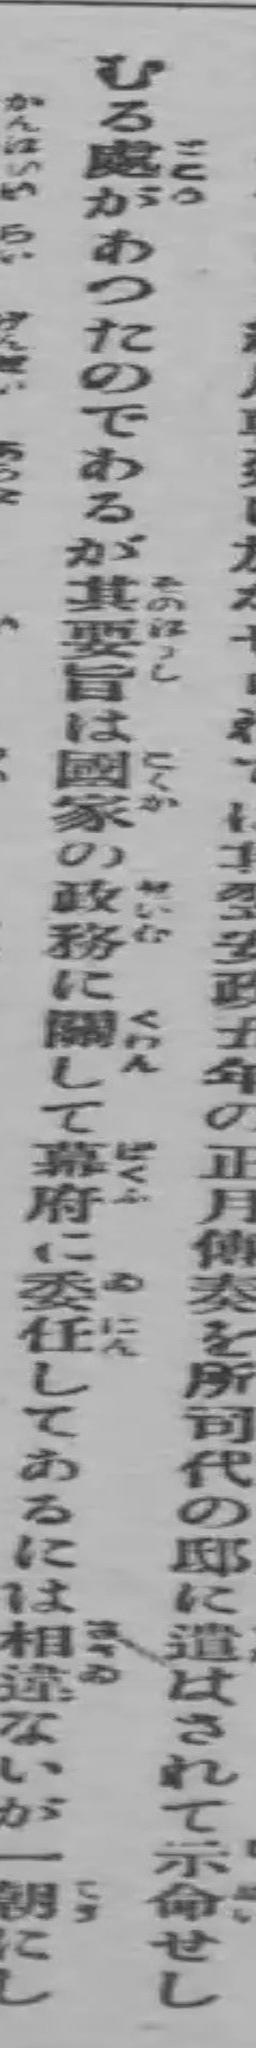むる処があつたのであるが其要旨は国家の政務に関して幕府に委任してあるには相違ないが一朝にし
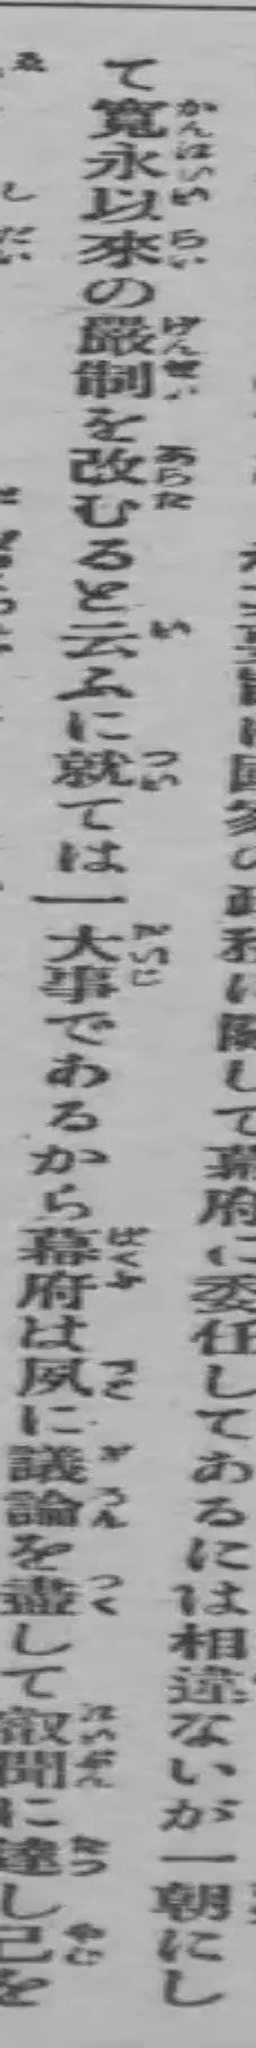て寛永以来の厳制を改むると云ふに就ては一大事であるから幕府は夙に議論を尽して叡聞に達し已を
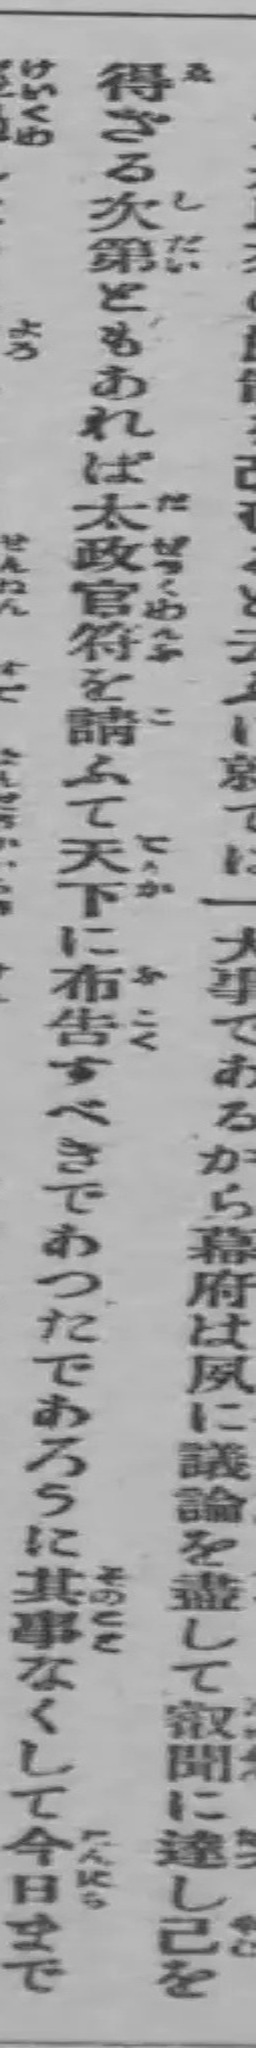得ざる次第ともあれば太政官符を請ふて天下に布告すべきであつたであろうに其事なくして今日まで
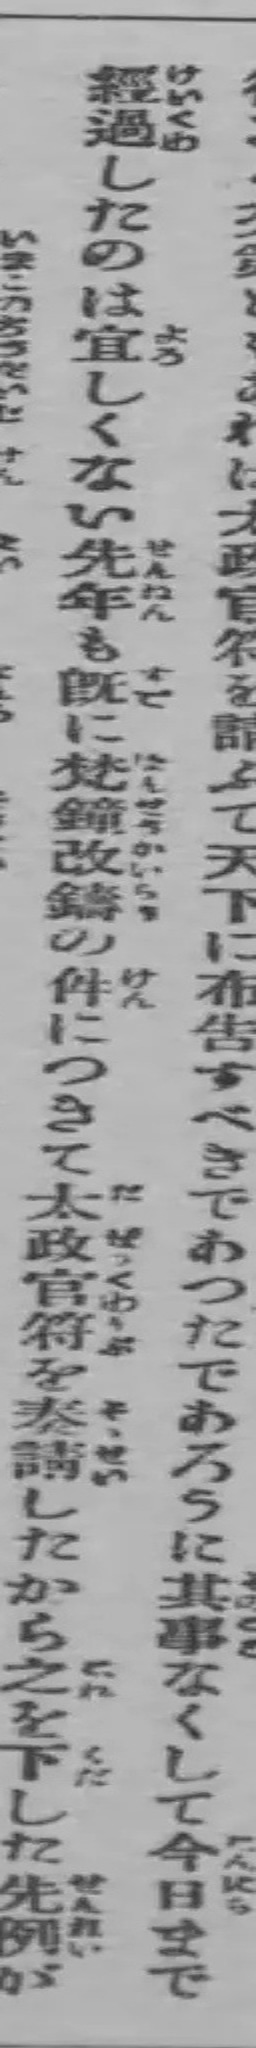経過したのは宜しくない先年も既に梵鐘改鋳の件につきて太政官符を奏請したから之を下した先例が
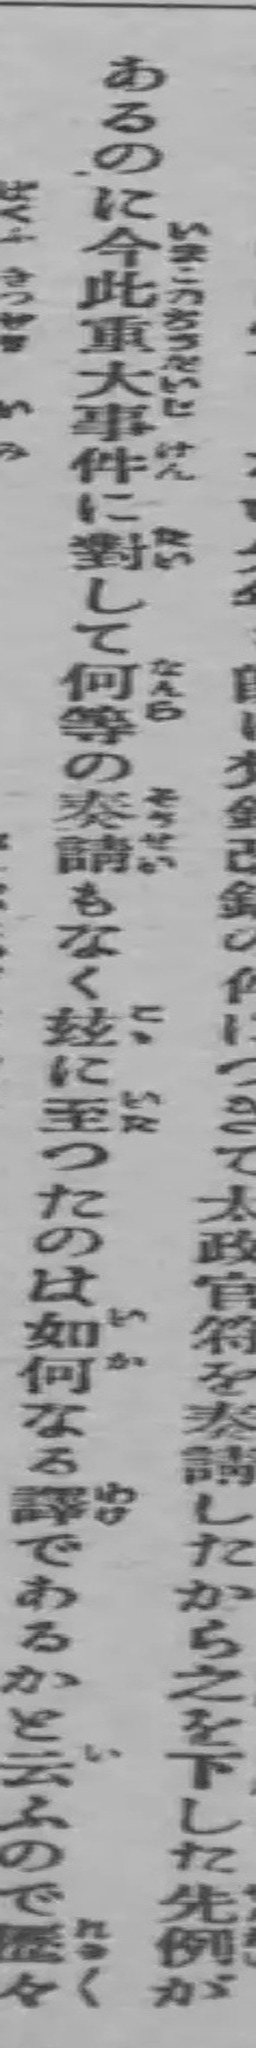あるのに今此重大事件に対して何等の奏請もなく茲に至つたのは如何なる訳であるかと云ふので歴々
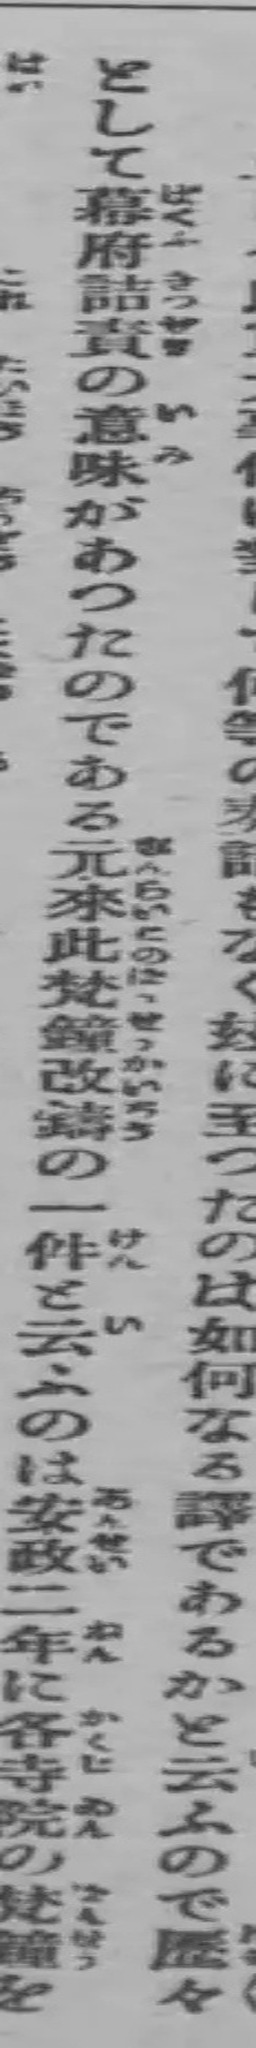として幕府詰責の意味があつたのである元来此梵鐘改鋳の一件と云ふのは安政二年に各寺院の梵鐘を
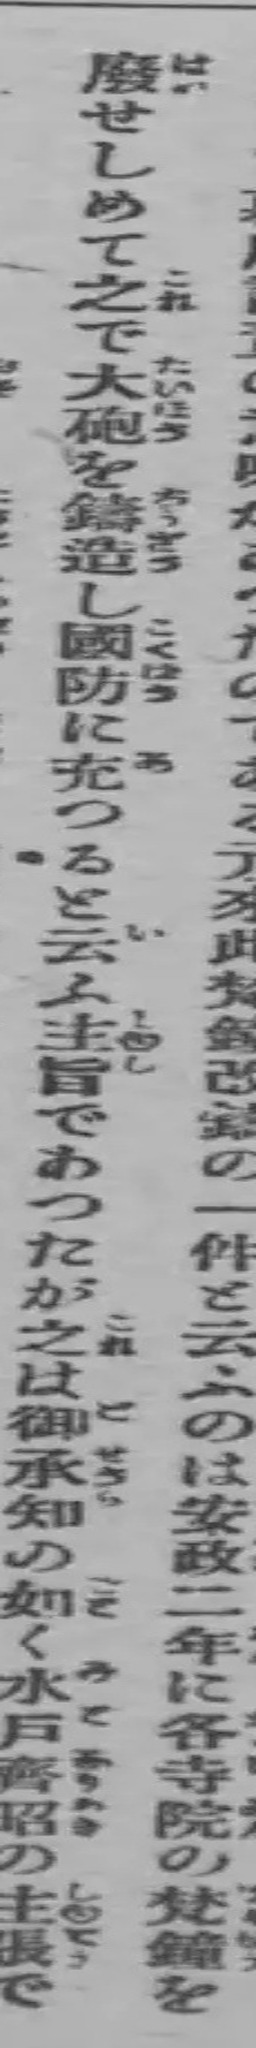廃せしめて之で大砲を鋳造し国防に充つると云ふ主旨であつたが之は御承知の如く水戸斉昭の主張で
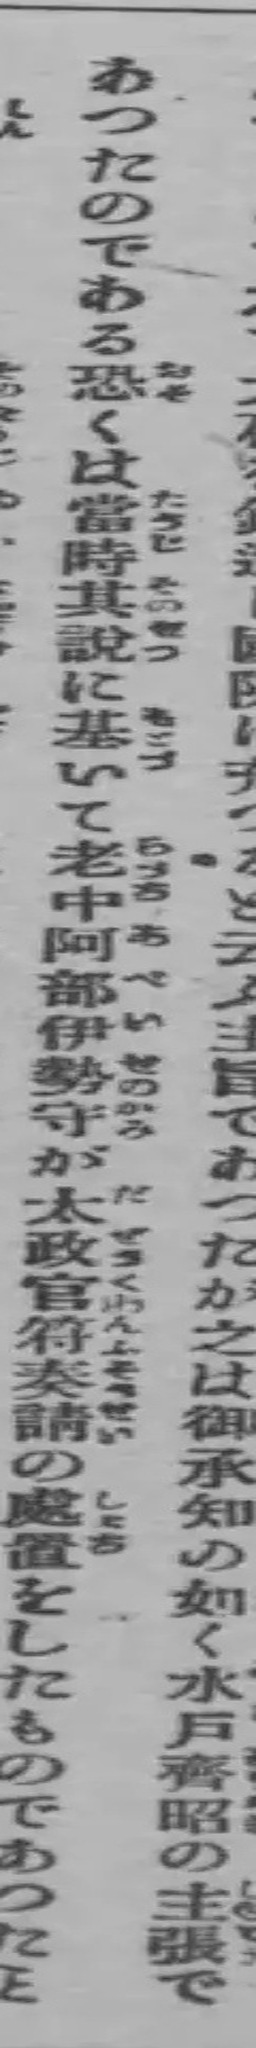あつたのである恐くは当時其説に基いて老中阿部伊勢守が太政官符奏請の処置をしたものであつたこと
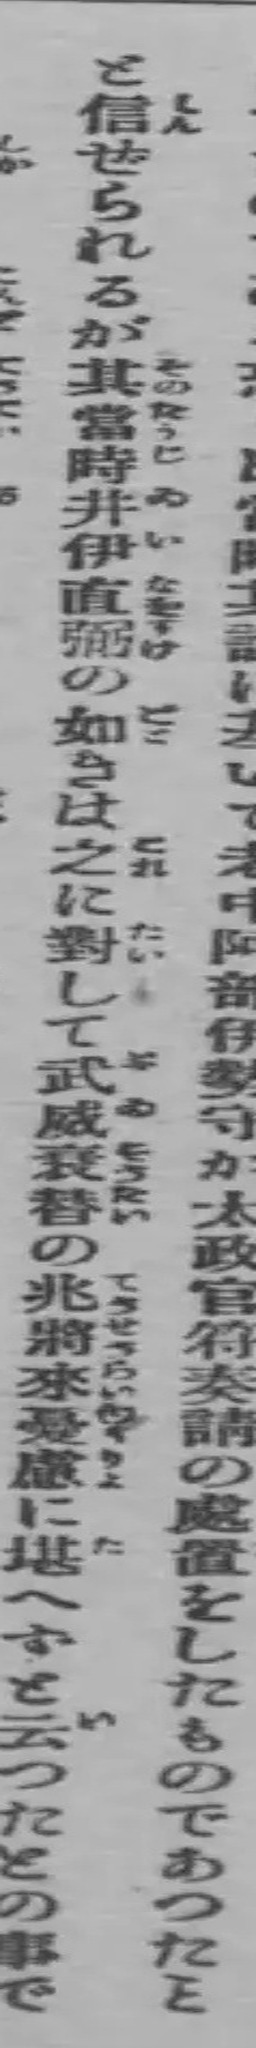と信ぜられるが其当時井伊直弼の如きは之に対して武威衰替の兆将来憂慮に堪へずと云つたとの事で
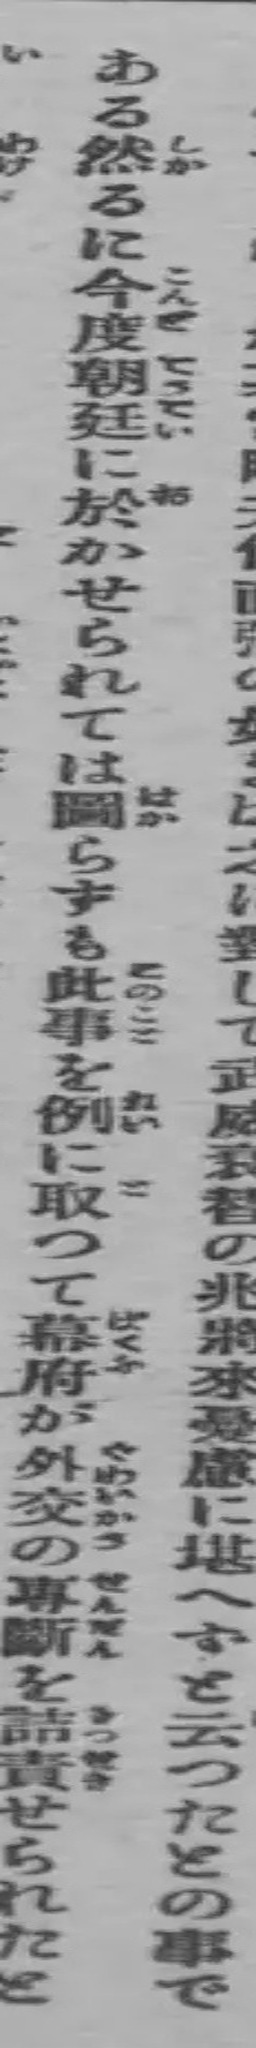ある然るに今度朝廷に於かせられては図らずも此事を例に取つて幕府が外交の専断を詰責せられたと
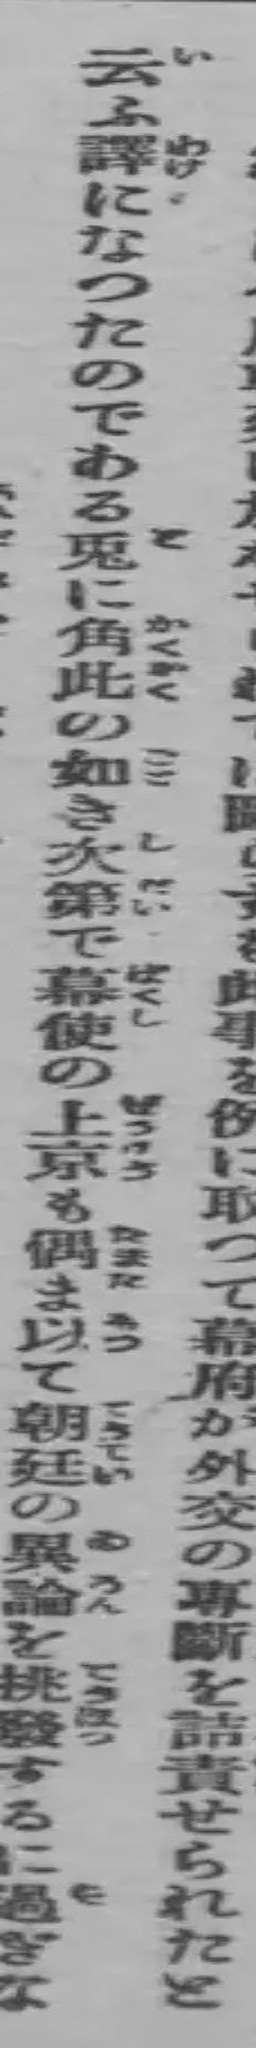云ふ訳になつたのである兎に角此の如き次第で幕使の上京も偶ま以て朝廷の異論を挑発するに過ぎな
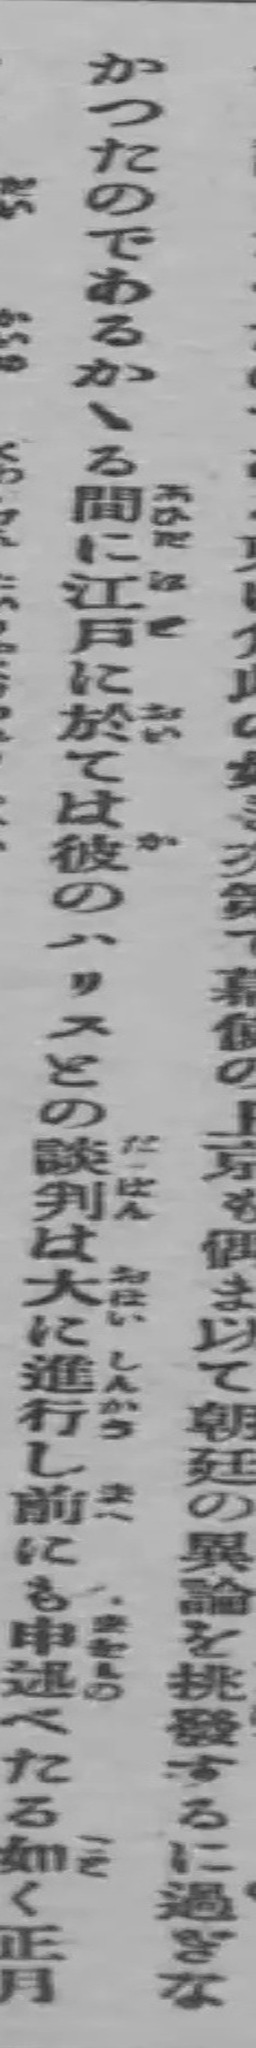かつたのであるかゝる間に江戸に於ては彼のハリスとの談判は大に進行し前にも申述べたる如く正月
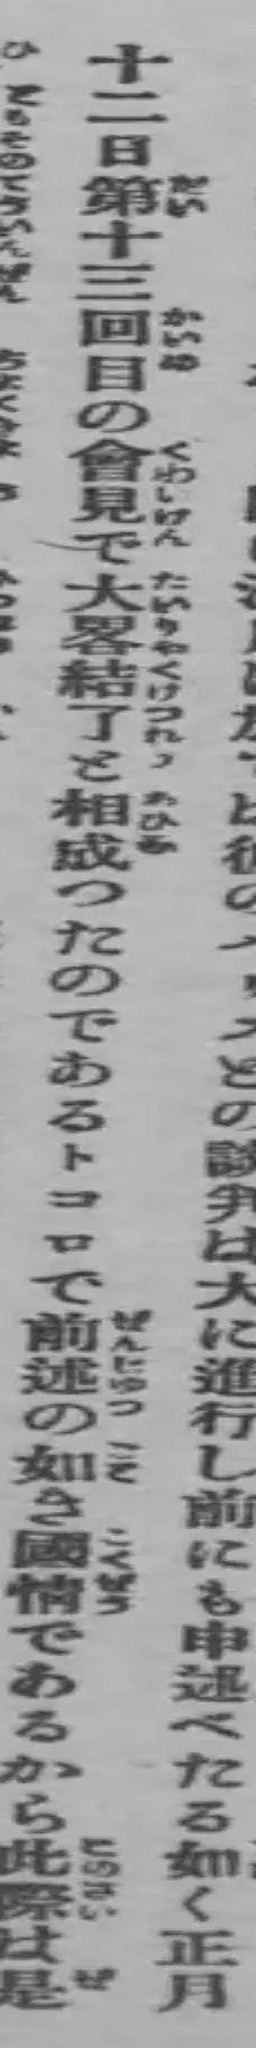十二日第十三回目の会見で大略結了と相成つたのであるトコロで前述の如き国情であるから此際は是
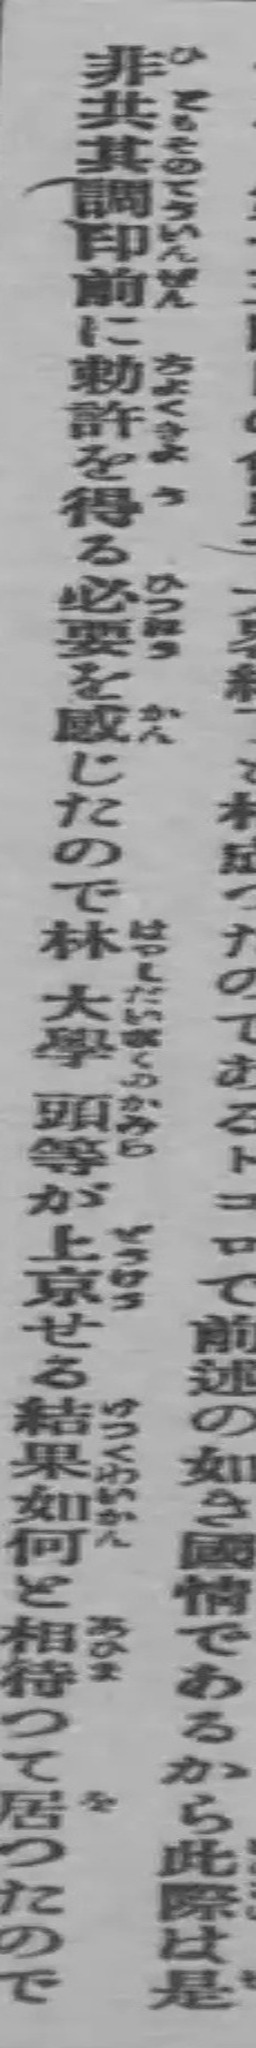非共其調印前に勅許を得る必要を感じたので林大学頭等が上京せる結果如何と相待つて居つたので
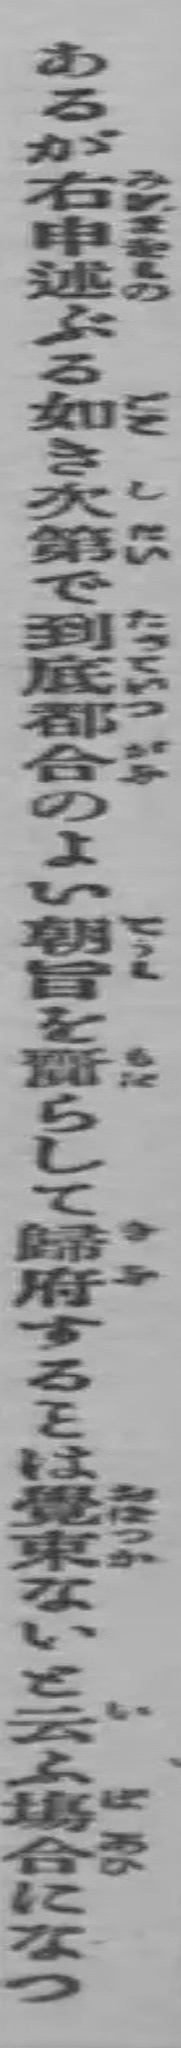あるが右申述ぶる如き次第で到底都合のよい朝旨を齎らして帰府することは覚束ないと云ふ場合になつ
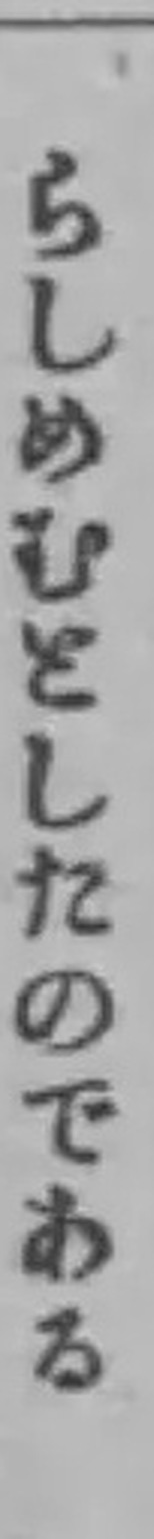らしめむとしたのである
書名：豊橋市史談
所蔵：国立国会図書館 National Diet Library, JAPAN
